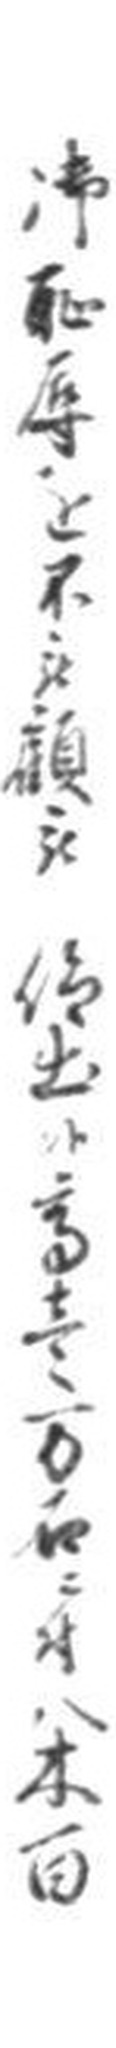御恥辱を不被顧被仰出候高壱万石ニ付八木百
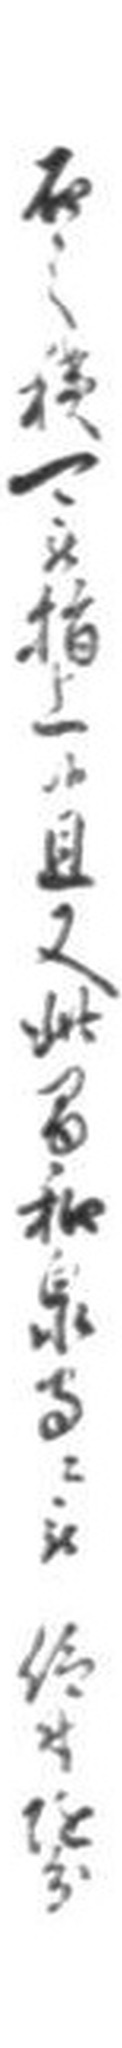石之積可被指上候且又此間和泉守ニ被仰付随分
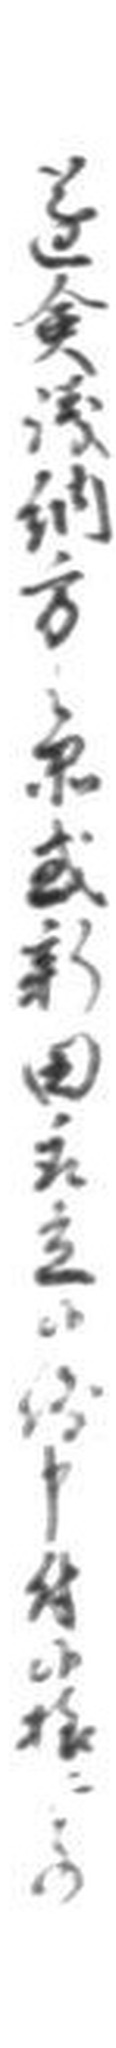遂僉議納方之品或新田取立候儀申付候様ニとの
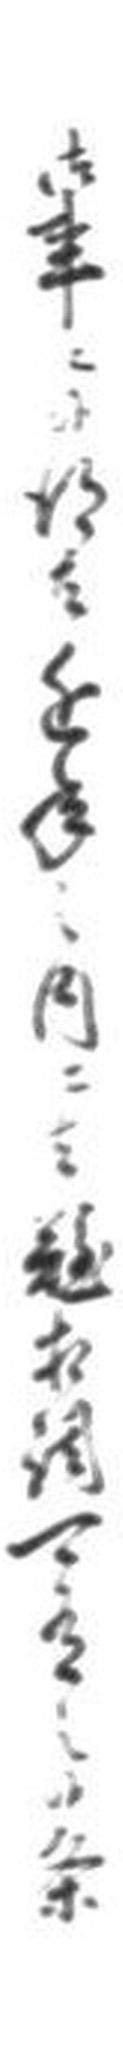御事ニ候得共近年之内ニ者難相調可有之候条
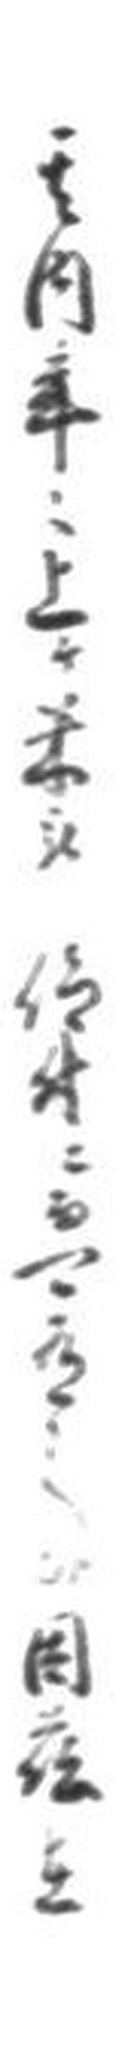其内年々上ケ米被仰付ニ而可有之候因茲在
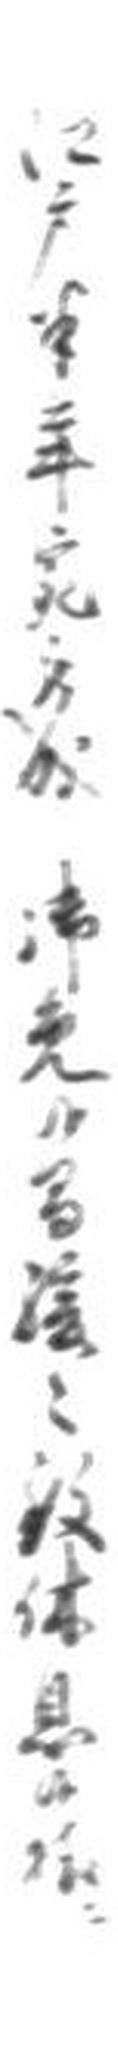江戸半年宛被成御免候間緩々致休息候様ニ
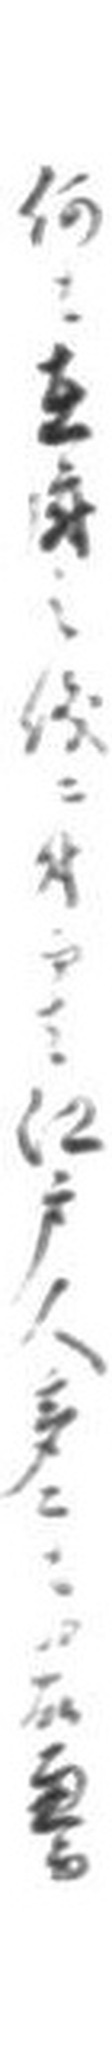何も在府之儀ニ付而者江戸人多ニ候故兼而
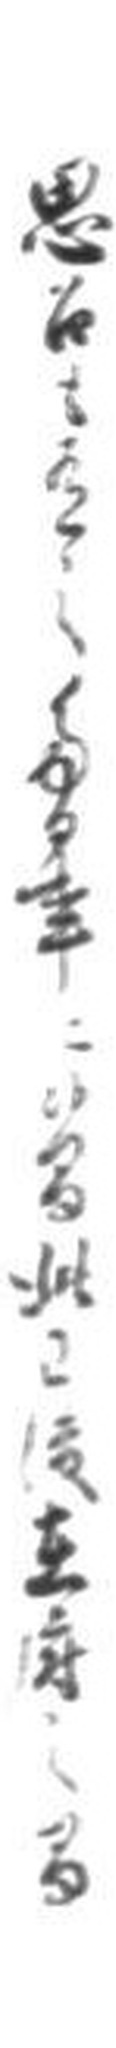思召も有之たる事ニ候間此已後在府之間
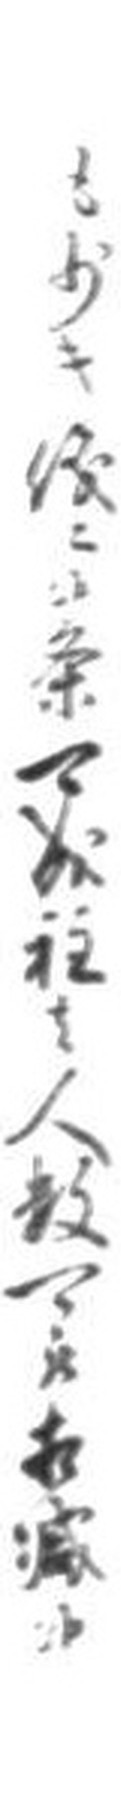も少キ儀ニ候条可成程者人数可被相減候

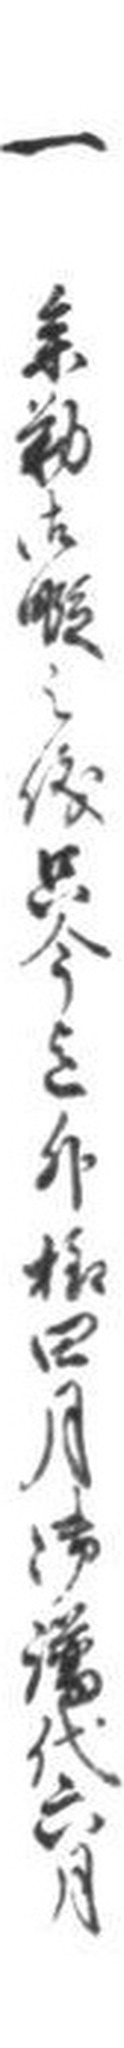一参勤御暇之儀只今迄外様四月御譜代六月
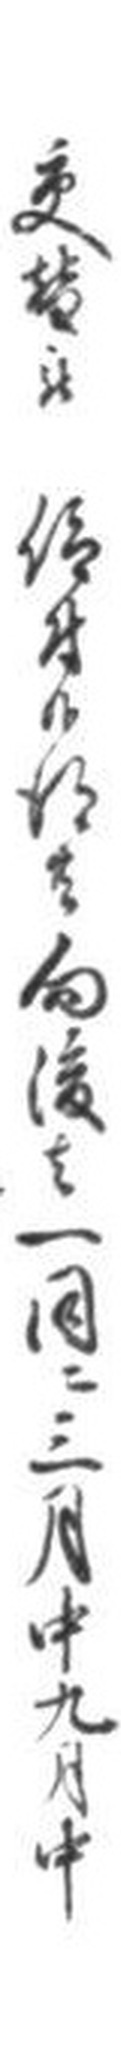交替被仰付候得共向後者一同ニ三月中九月中
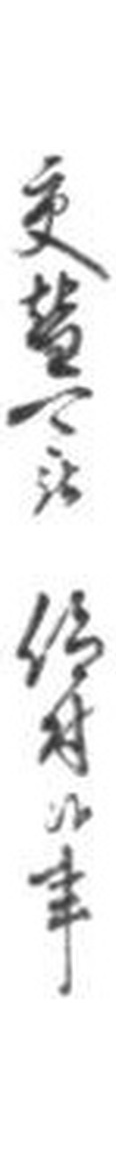交替可被仰付候事
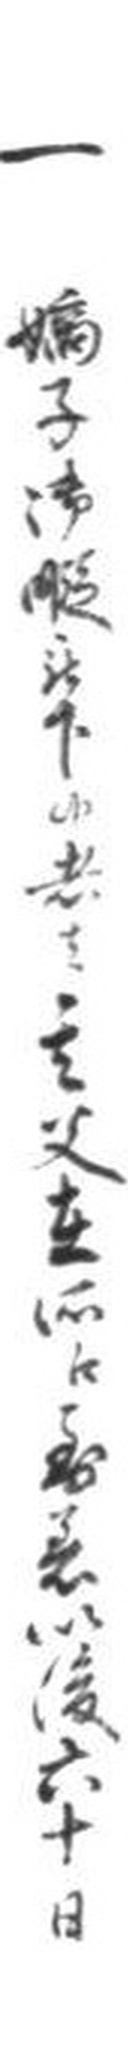一嫡子御暇被下候者者其父在所江到着以後六十日
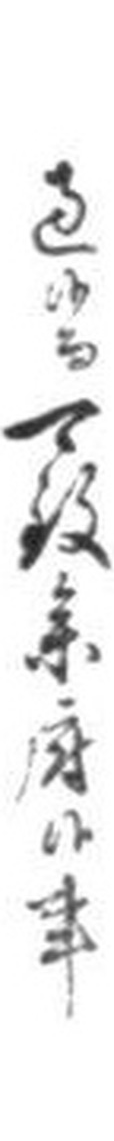過候而可致参府候事
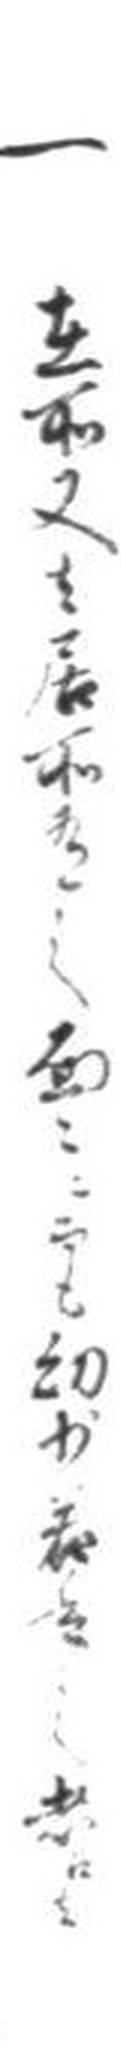一在所又者居所有之面々ニ而も幼少若年之者江者
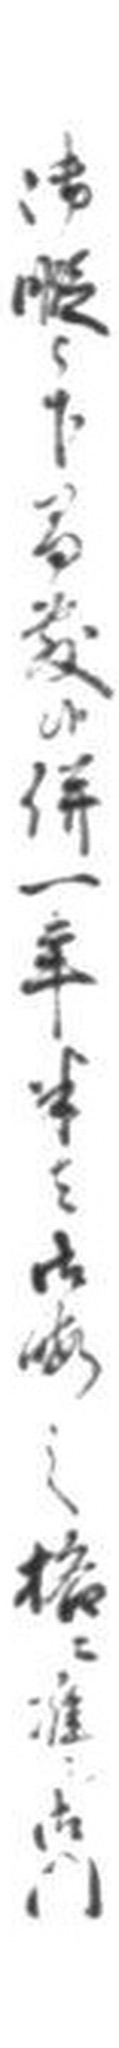御暇被下間敷候併一年半者御暇之格ニ准シ御門
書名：家譜 三十五 宗昌公 従享保六年到同七年
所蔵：福井県文書館 Fukui Prefectural Archives
